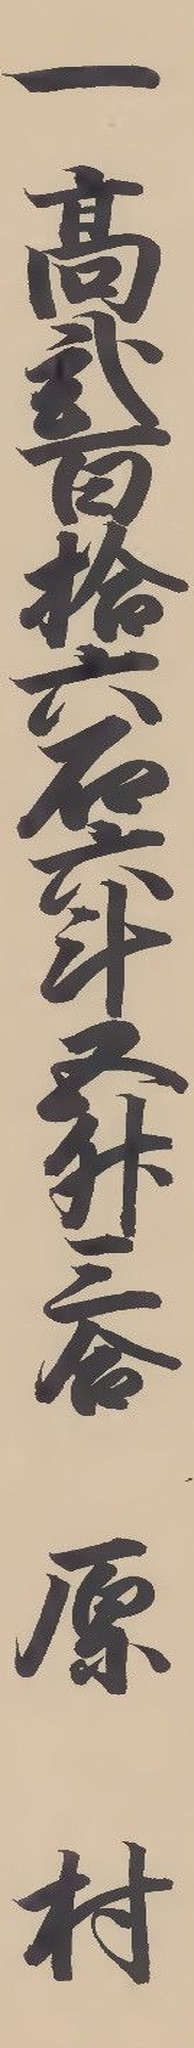一高弐百拾六石六斗五升三合原村
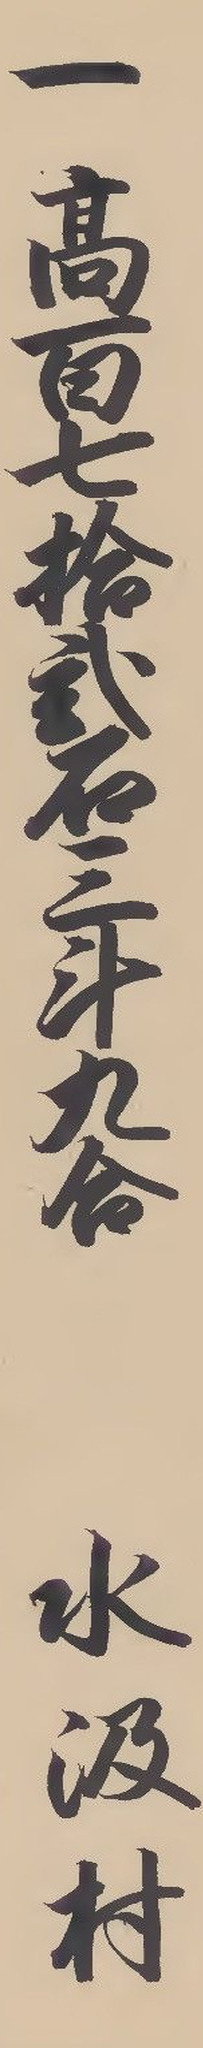一高百七拾弐石三斗九合水汲村

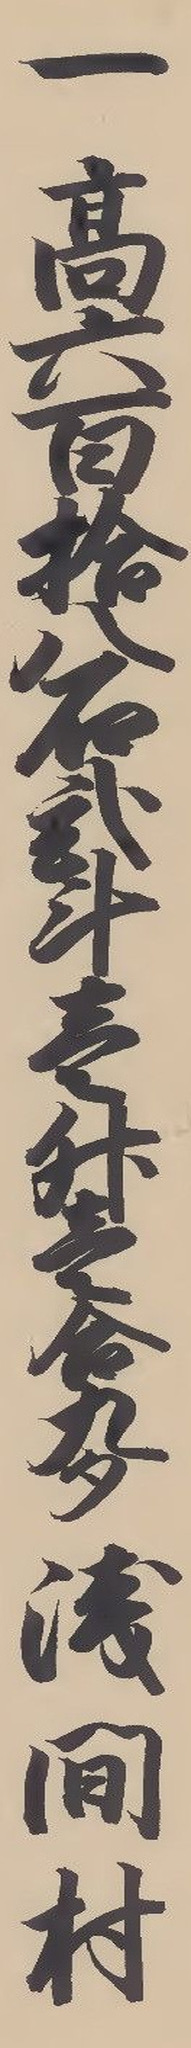一高六百拾八石弐斗壱升壱合九勺浅間村
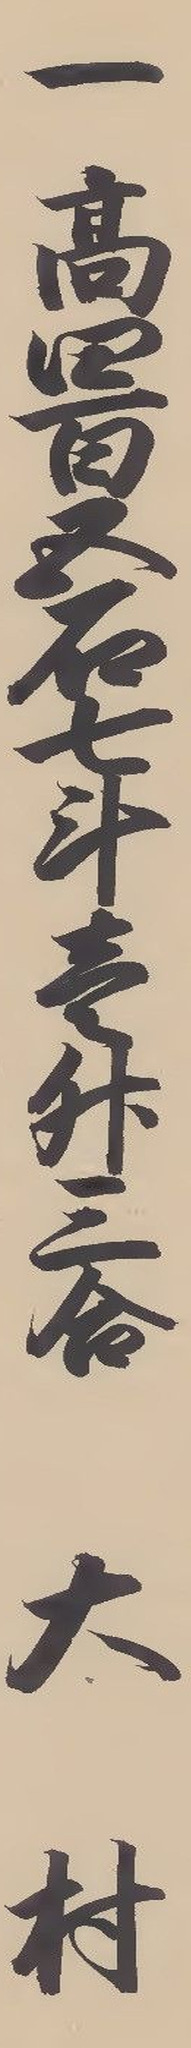一高四百五石七斗壱升三合大村
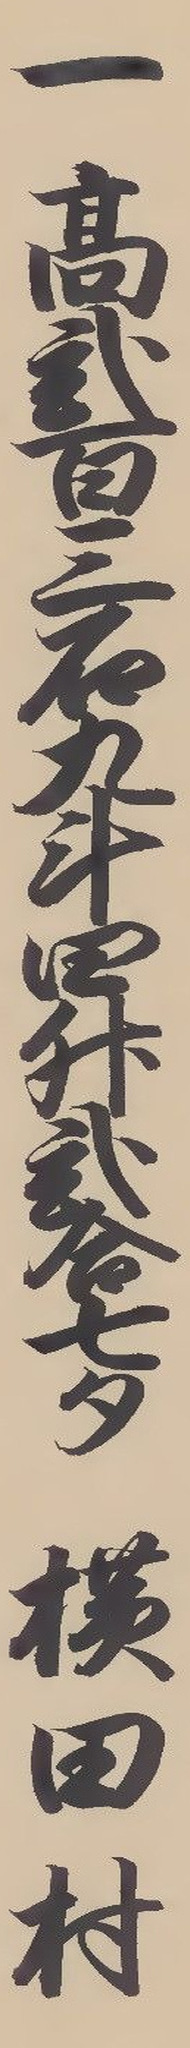一高弐百三石九斗四升弐合七勺横田村
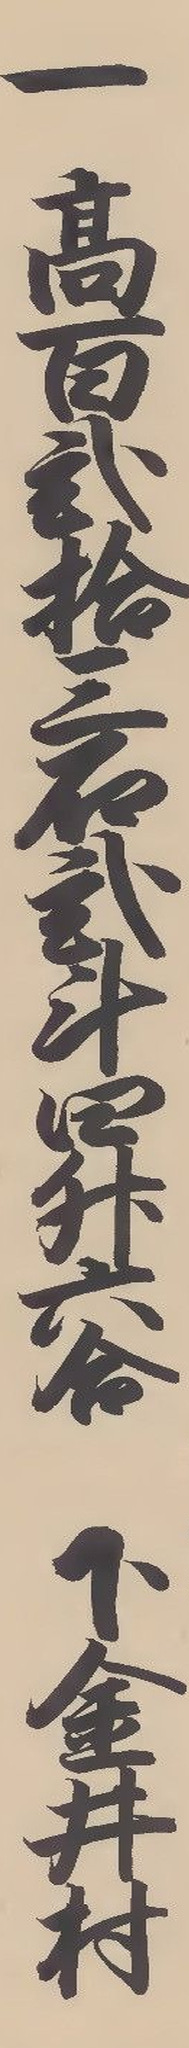一高百弐拾三石弐斗四升六合下金井村
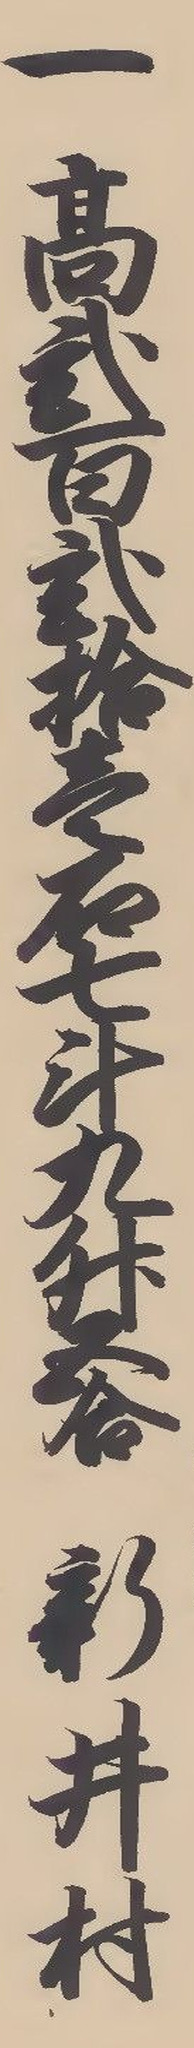一高弐百弐拾壱石七斗九升五合新井村

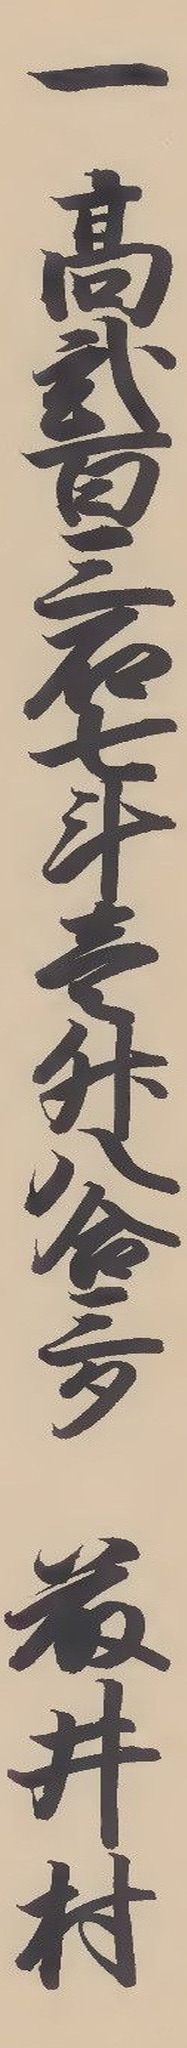一高弐百三石七斗壱升八合三勺藤井村
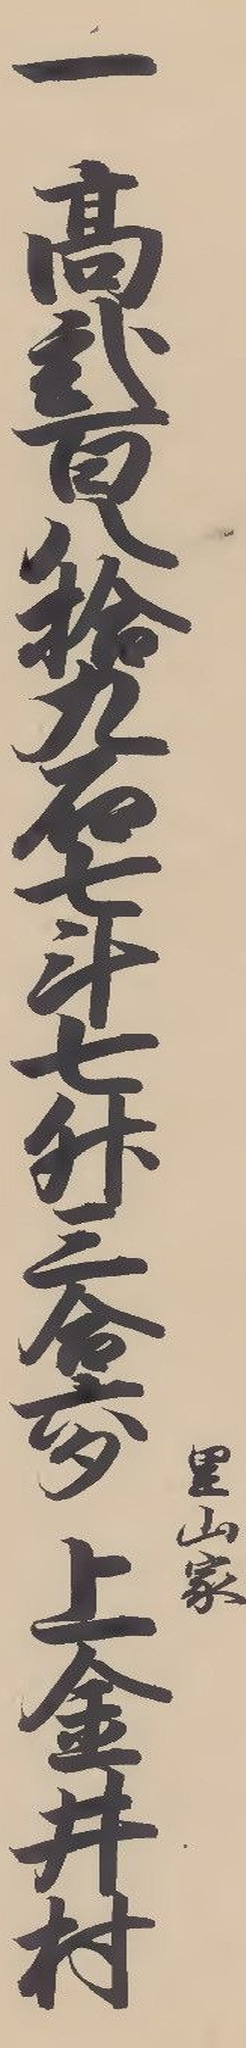一高弐百八拾九石七斗七升三合六勺上金井村
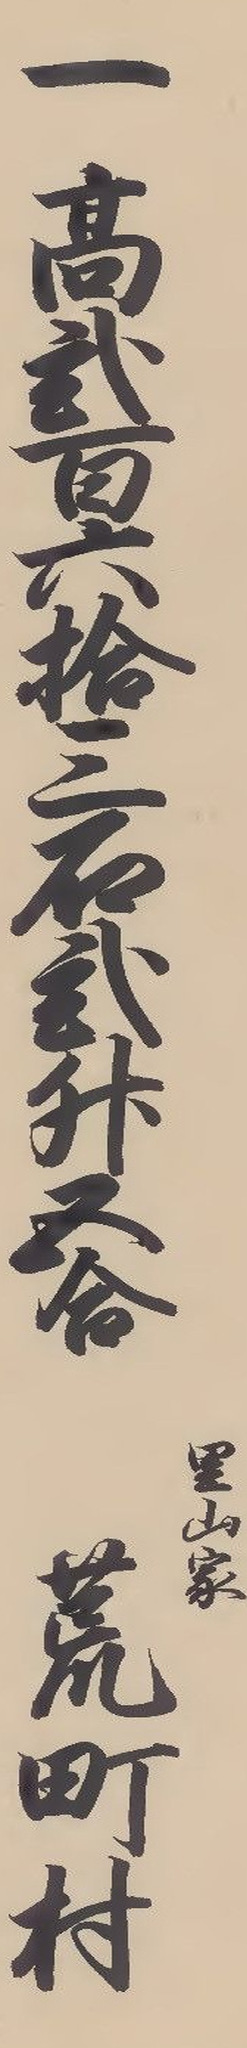一高弐百六拾三石弐升五合荒町村
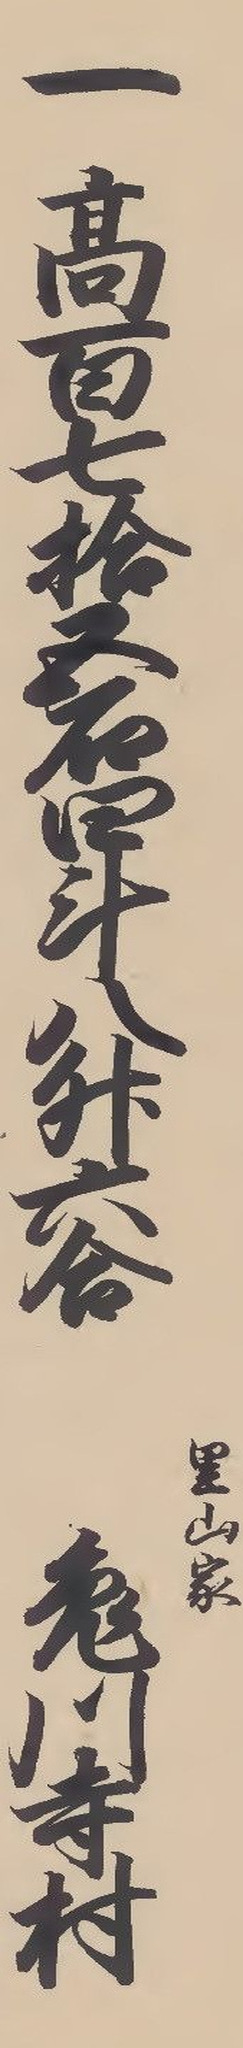一高百七拾五石四斗八升六合兎川寺村
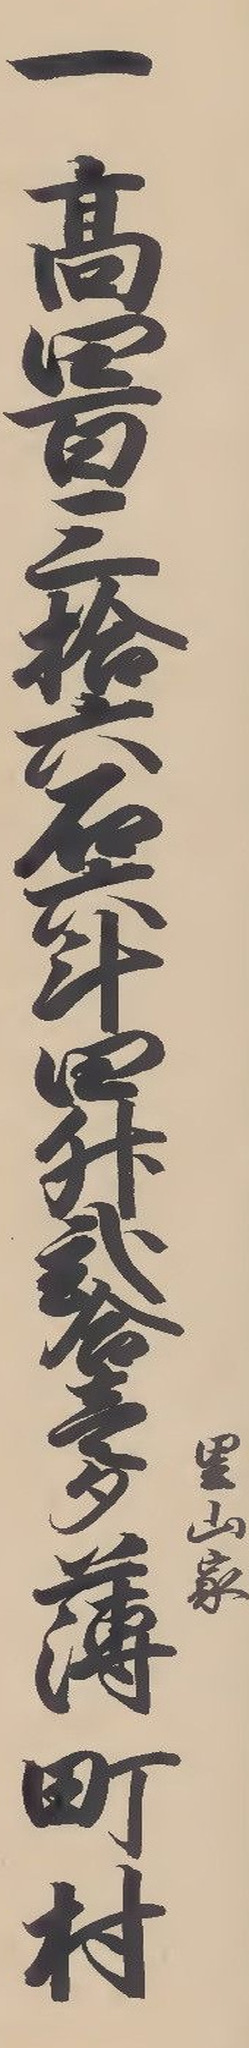一高四百三拾六石六斗四升弐合壱勺薄町村
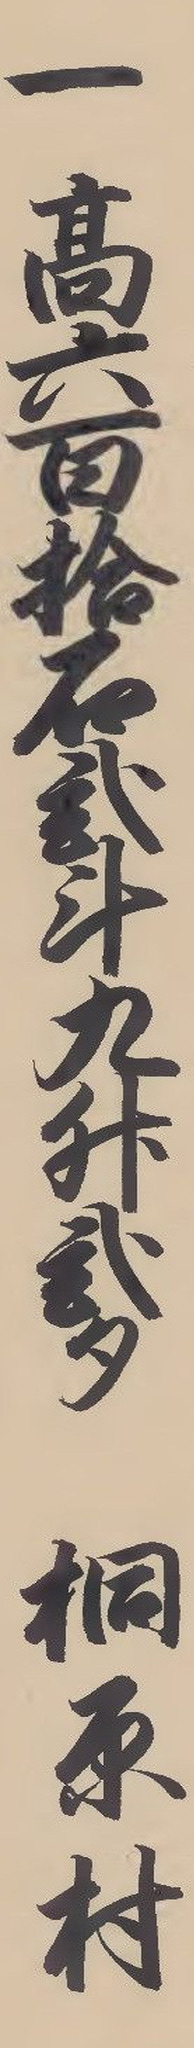一高六百拾石弐斗九升弐勺桐原村
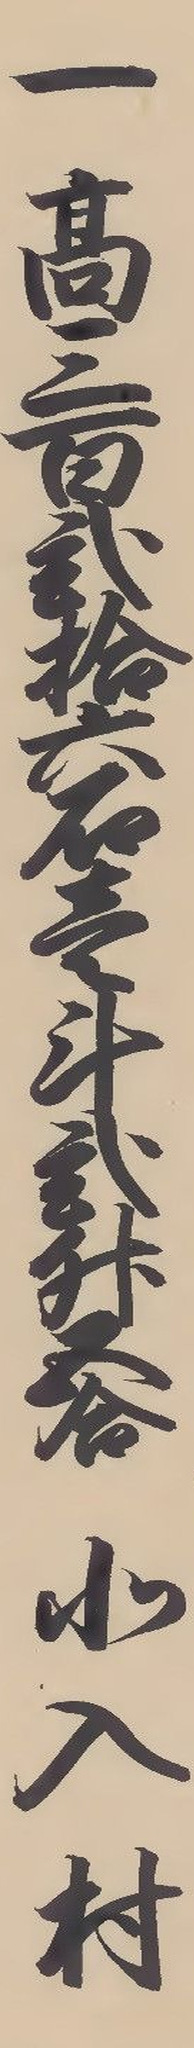一高三百弐拾六石壱斗弐升五合北入村
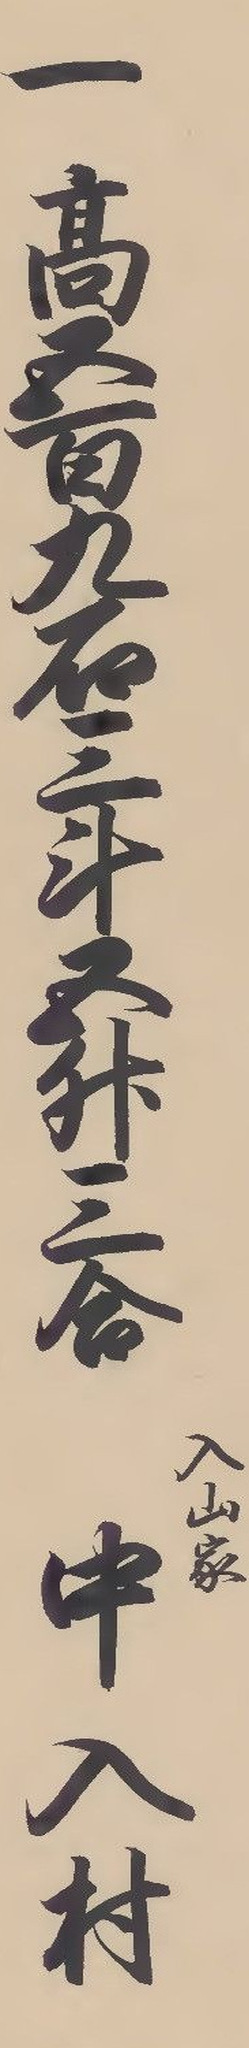一高五百九石三斗五升三合中入村

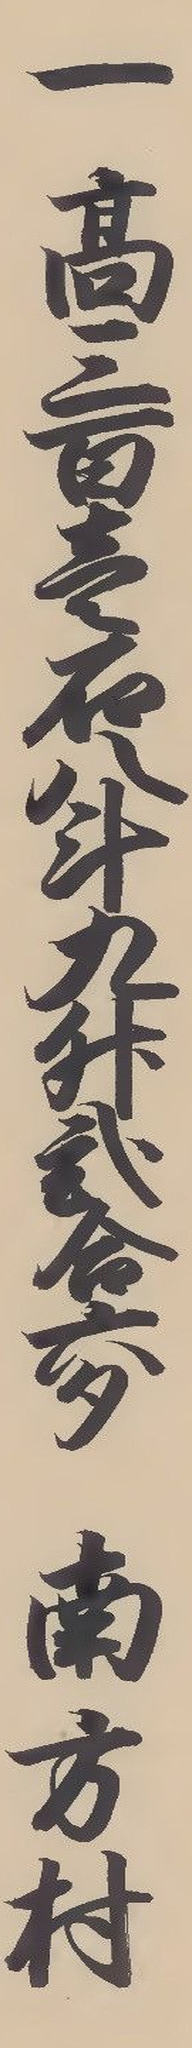一高三百壱石八斗九升弐合六勺南方村
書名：信濃国郷帳
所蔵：国立公文書館 National Archives of Japan
